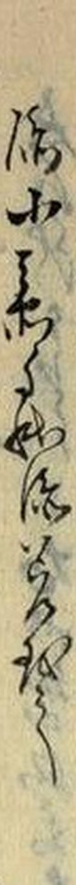添小兵衛手紙添差越之
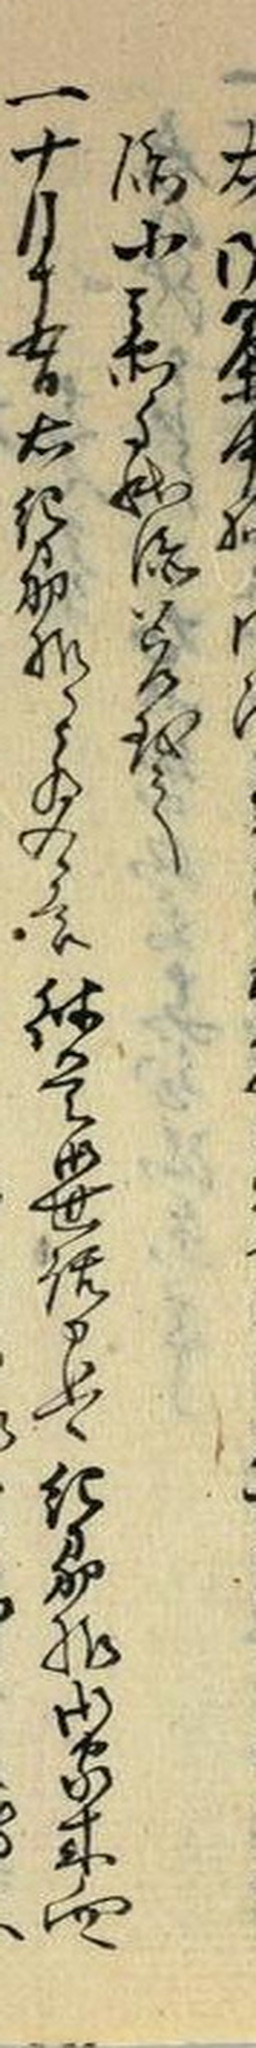一十月十五日右紀州様へ被為入候節彼是御世話申上候紀州様御家来向へ
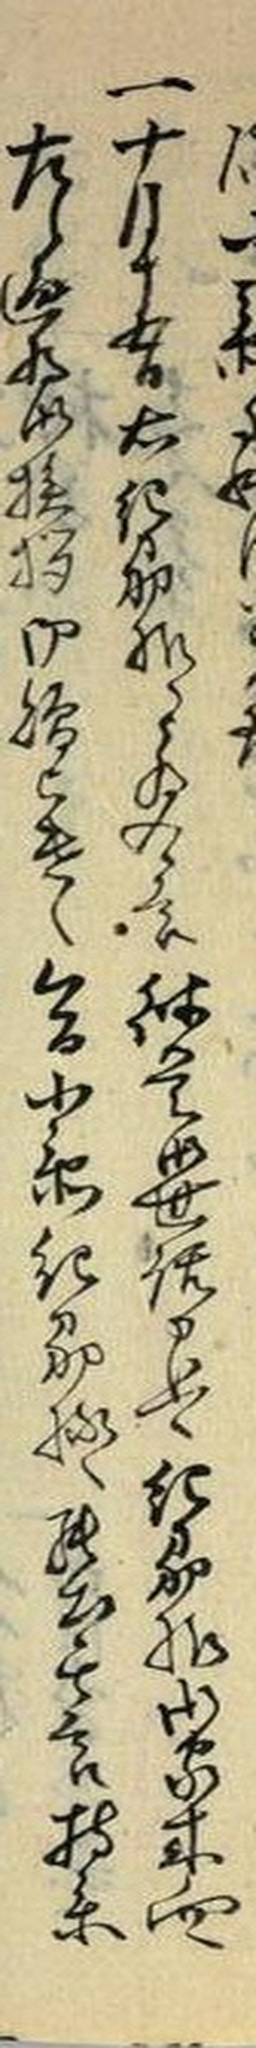左之通為御挨拶御贈被遣之今日小兵衛紀州様へ罷出其節持参
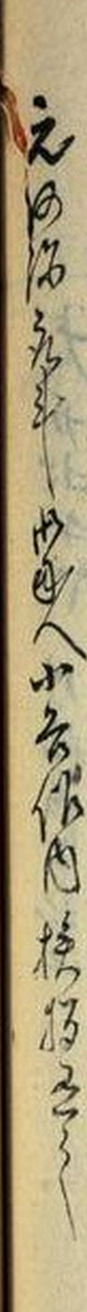元阿弥取計御用人小谷作内挨拶有之
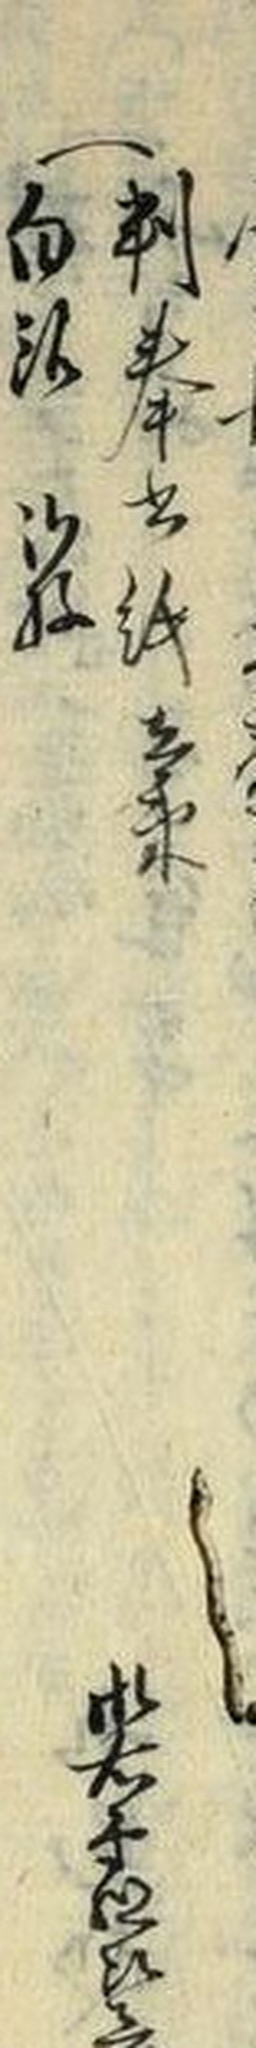白銀弐枚御右筆壱人
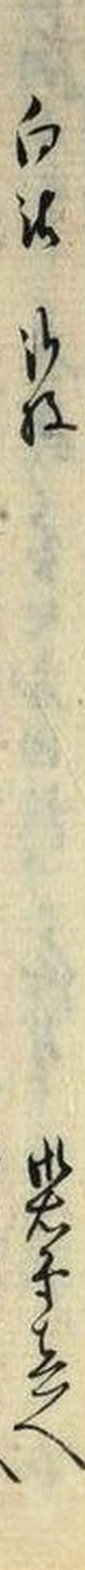白銀弐枚御右筆壱人
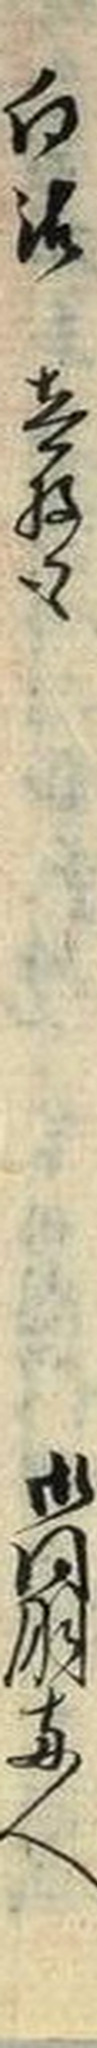白銀壱枚ツヽ御同朋両人
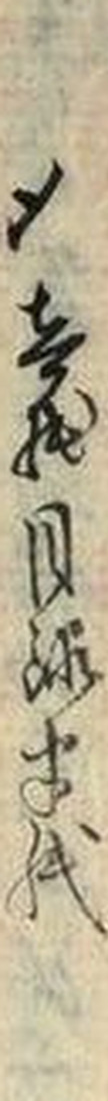〆壱紙目録半紙
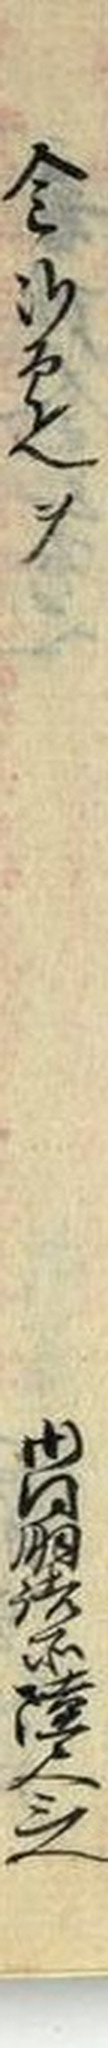金弐百疋ヲ御同朋詰所陸尺三人

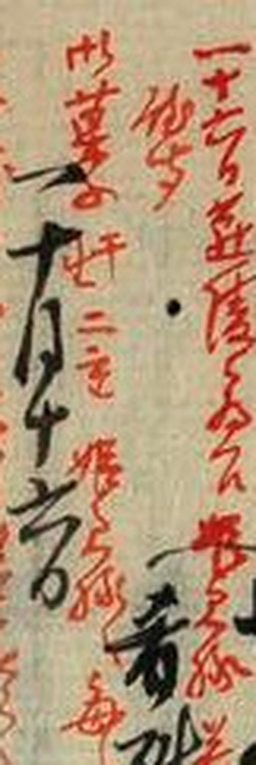一十月十六日
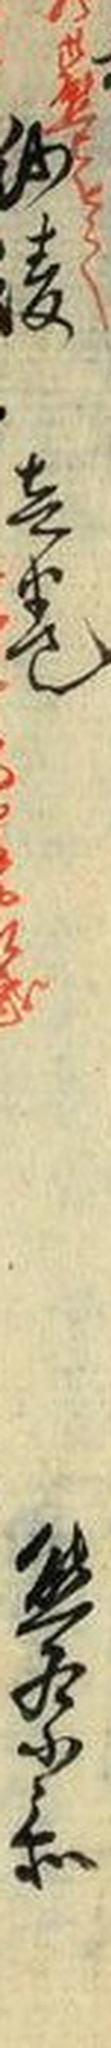紗綾壱巻熊谷小兵衛
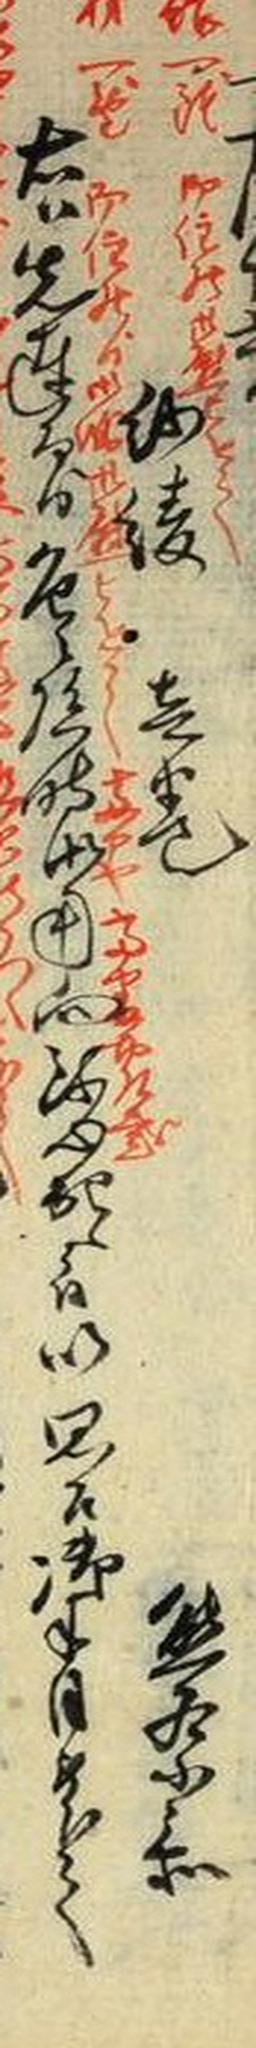右ハ先達而ゟ色々臨時御用向致心配候二付以思召御手自被進之
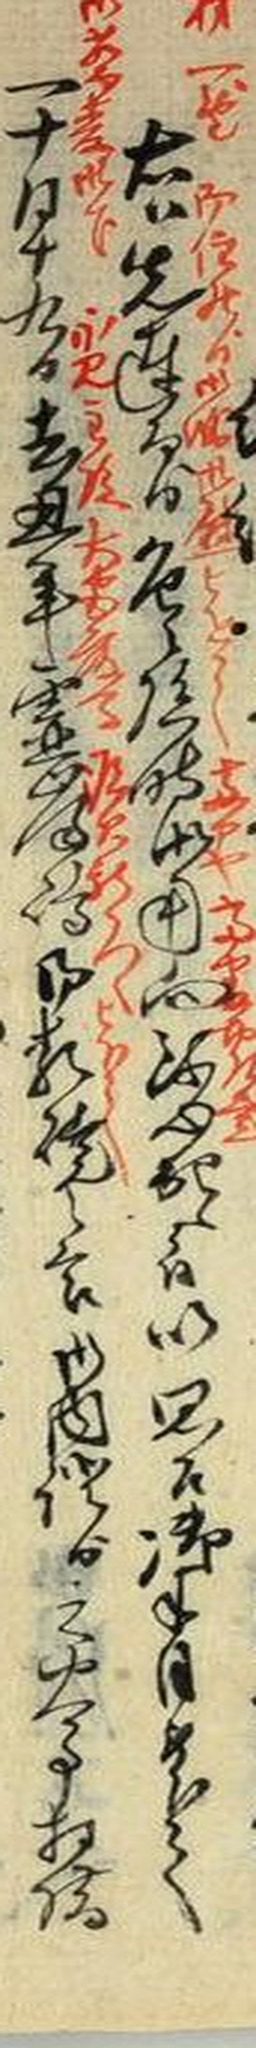一十月十九日去丑年霊岸嶋御類焼之節御内証ゟ之火事拝借
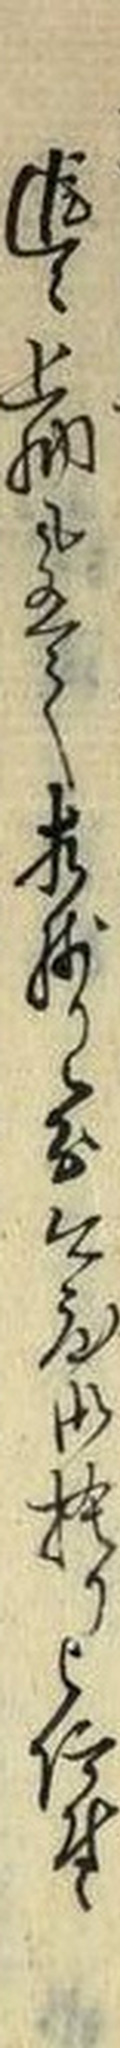追々上納も有之相残り候分今度御捨り被仰付候
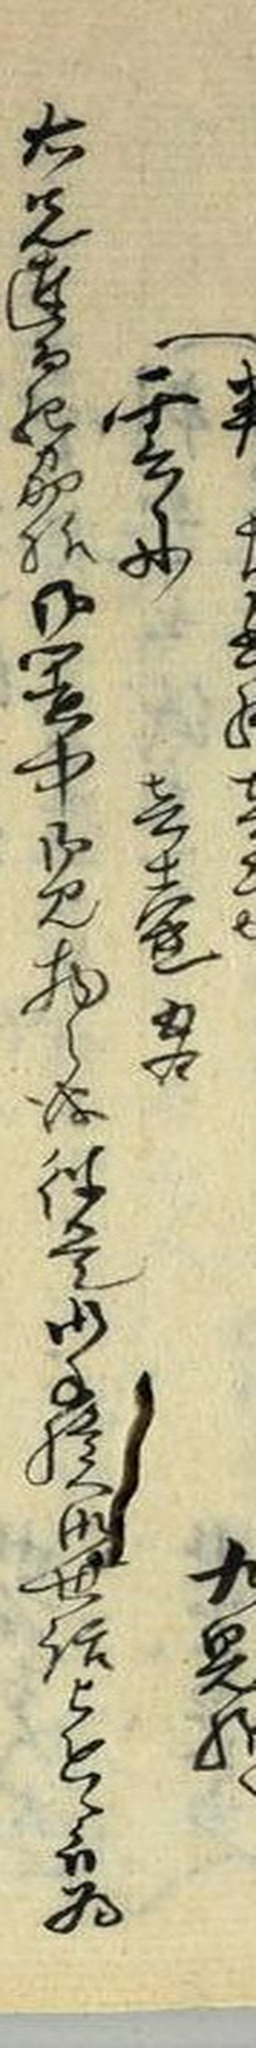右先達而紀州様へ御園中御見物之儀彼是御手続御世話被進候ニ付為
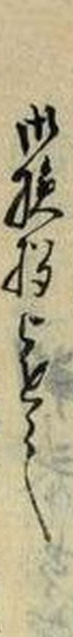御挨拶被進之
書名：少傅日録抄（斉承付側向頭取日記、在府）
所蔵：福井県文書館 Fukui Prefectural Archives
